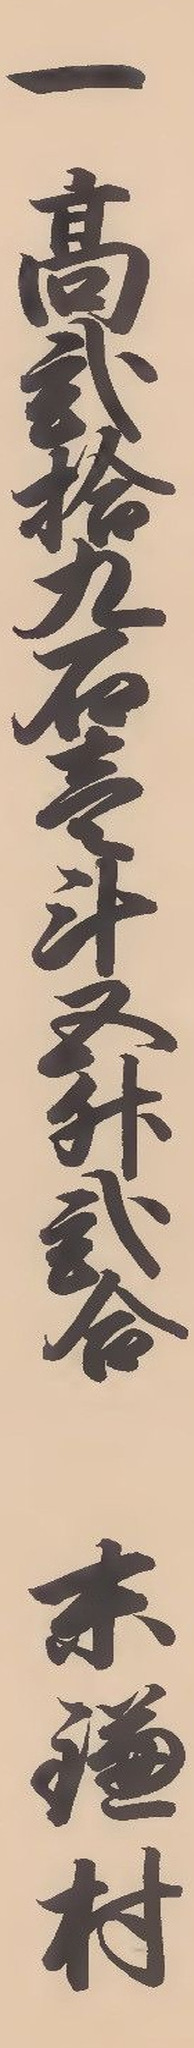一高弐拾九石壱斗五升弐合末鎌村
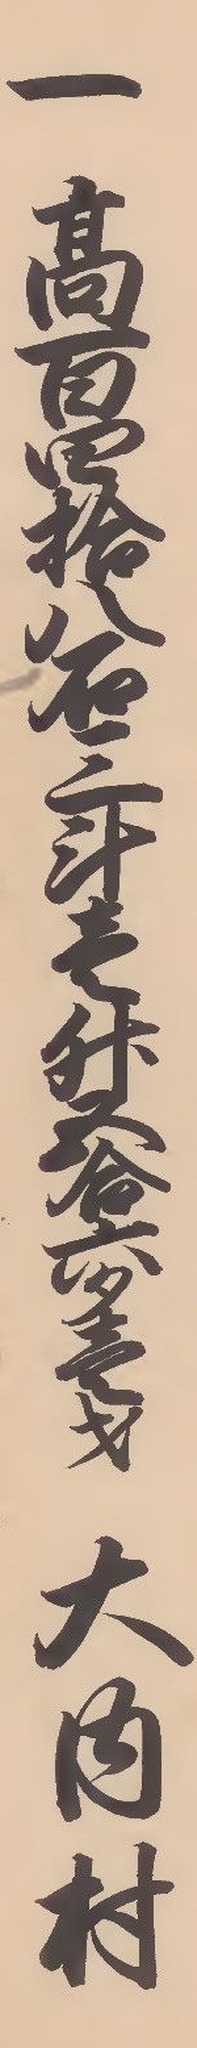一高百四拾八石三斗壱升五合六勺壱才大内村

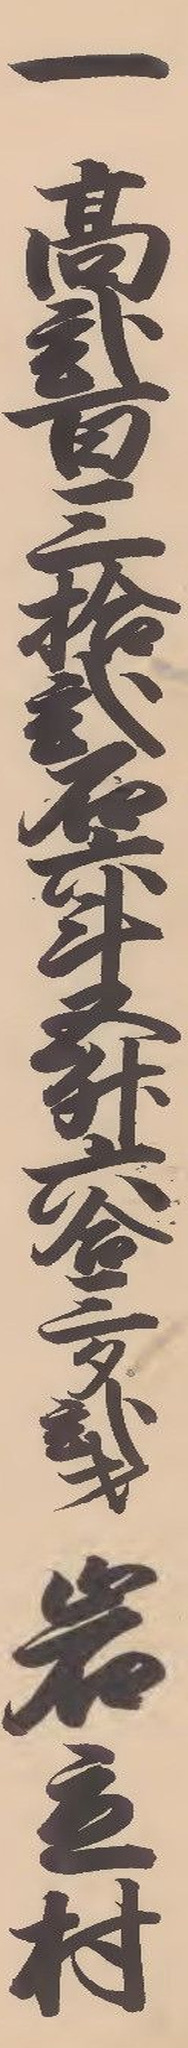一高弐百三拾弐石六斗五升六合三勺弐才岩立村
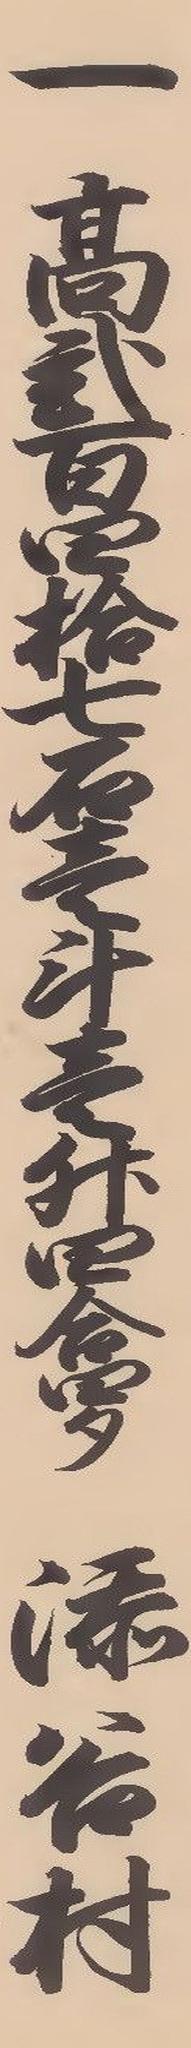一高弐百四拾七石壱斗壱升四合四勺添谷村
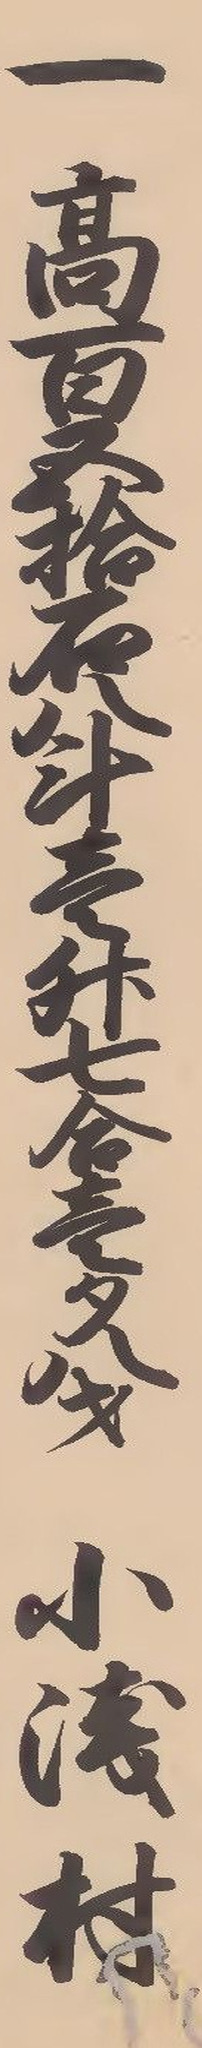一高百五拾石八斗壱升七合壱勺八才小浅村
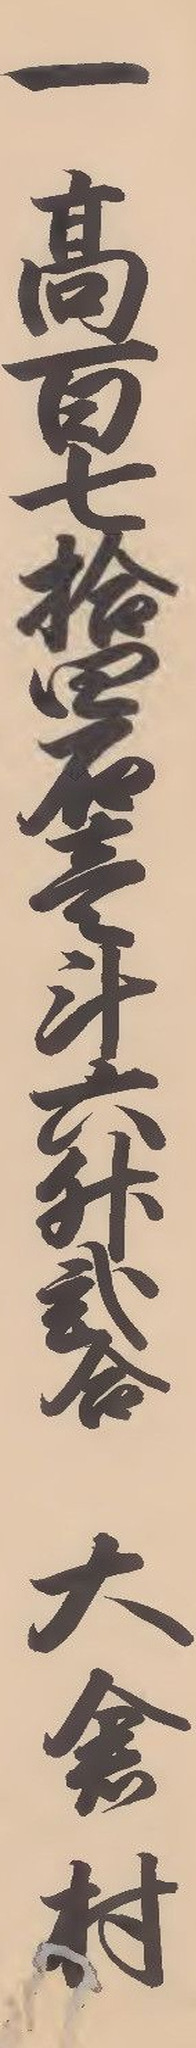一高百七拾四石壱斗六升弐合大倉村
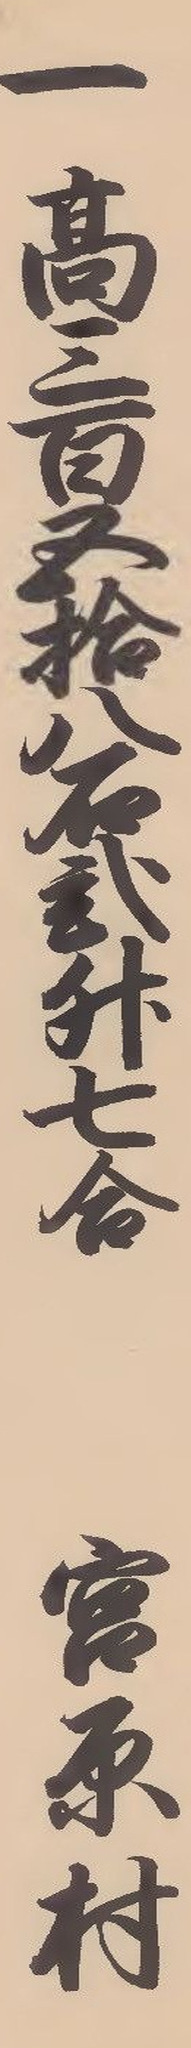一高三百五拾八石弐升七合宮原村
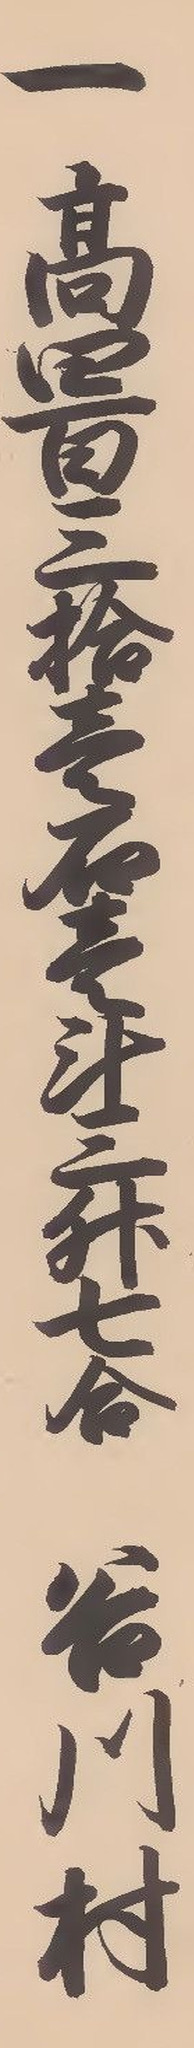一高四百三拾壱石壱斗三升七合谷川村
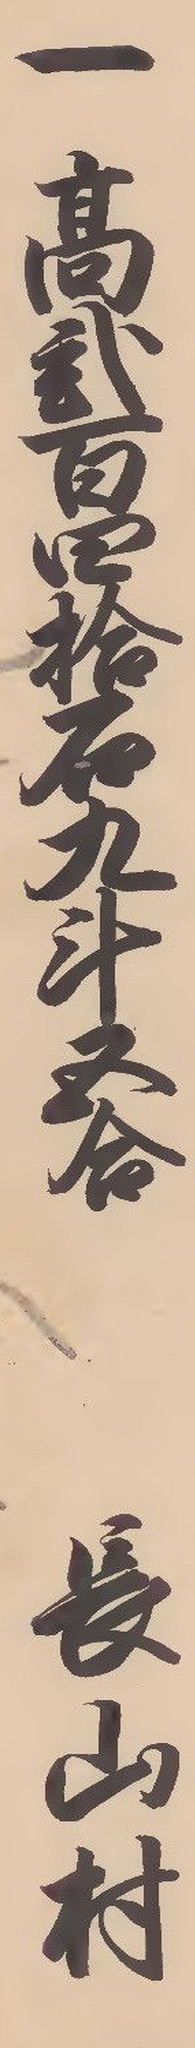一高弐百四拾石九斗五合長山村

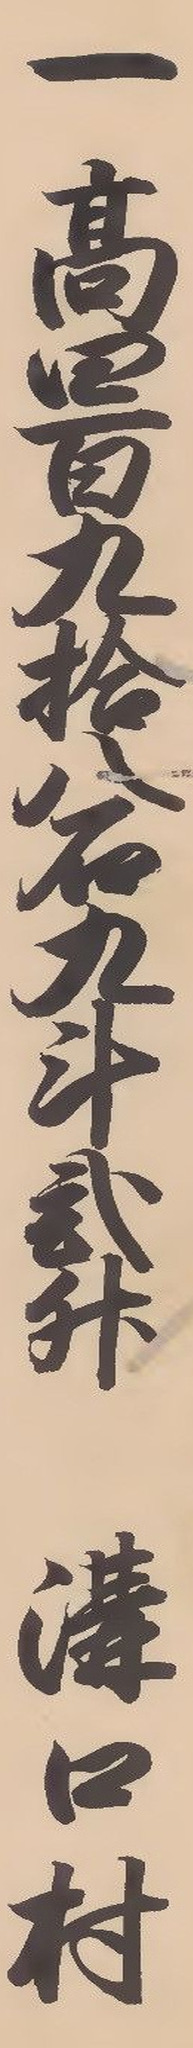一高四百九拾八石九斗弐升溝口村
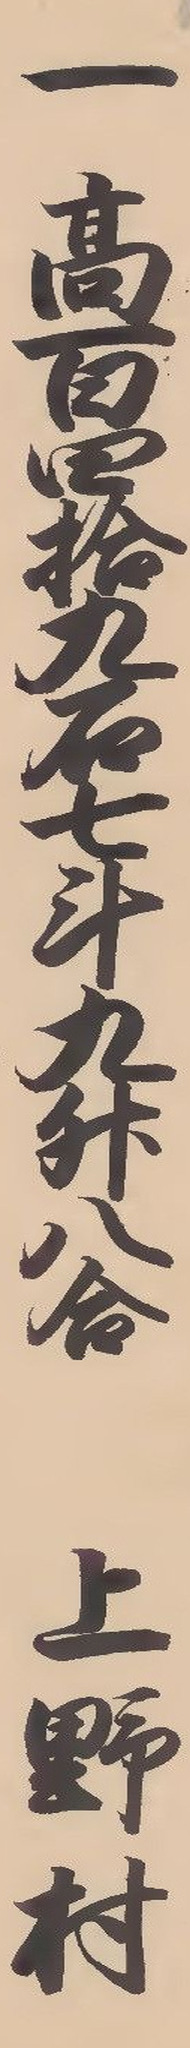一高百四拾九石七斗九升八合上野村
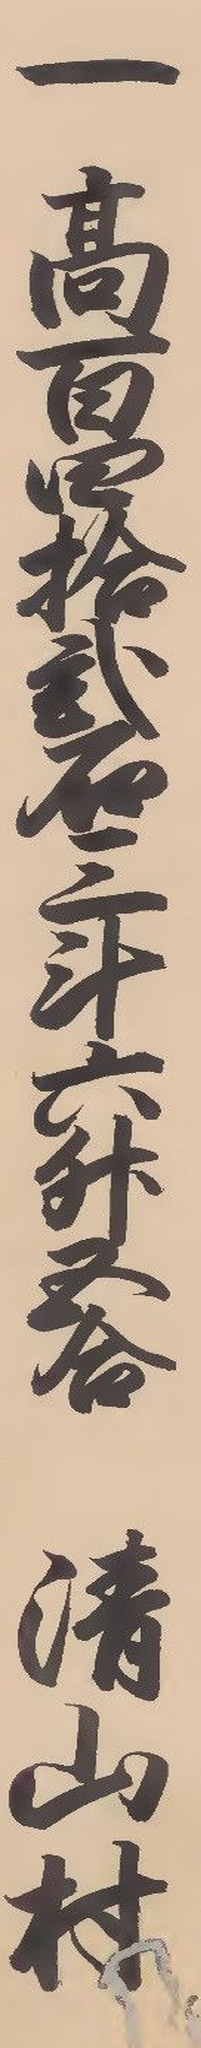一高百四拾弐石三斗六升五合清山村
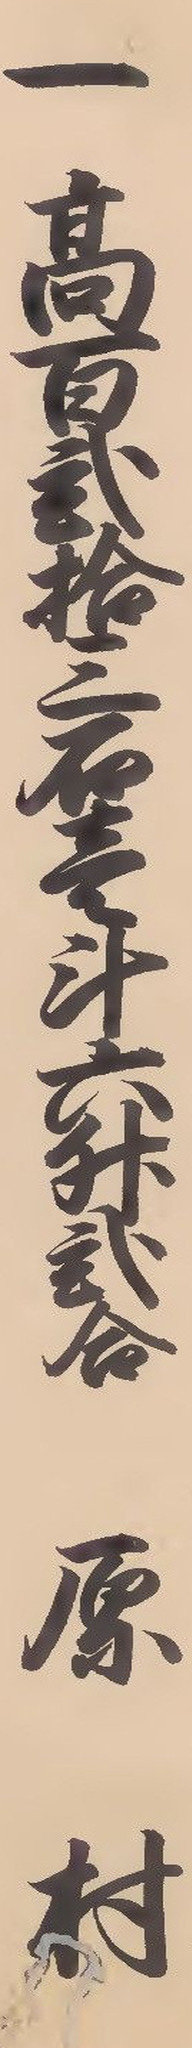一高百弐拾三石壱斗六升弐合原村
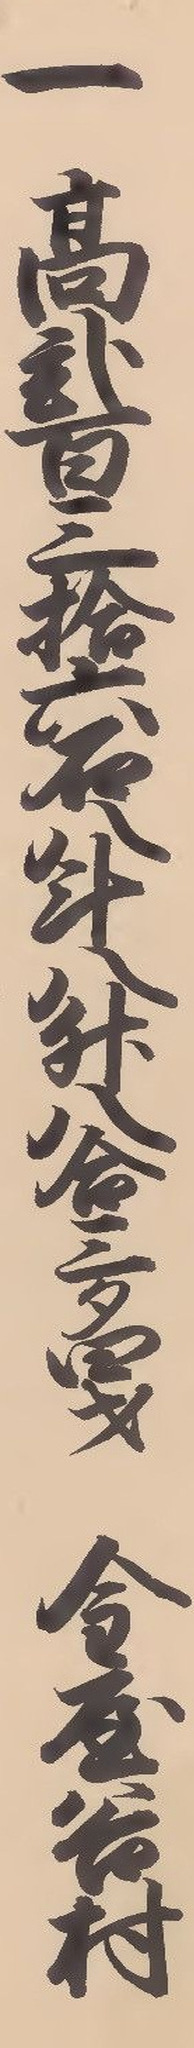一高弐百三拾六石八斗八升八合三勺四才金屋谷村
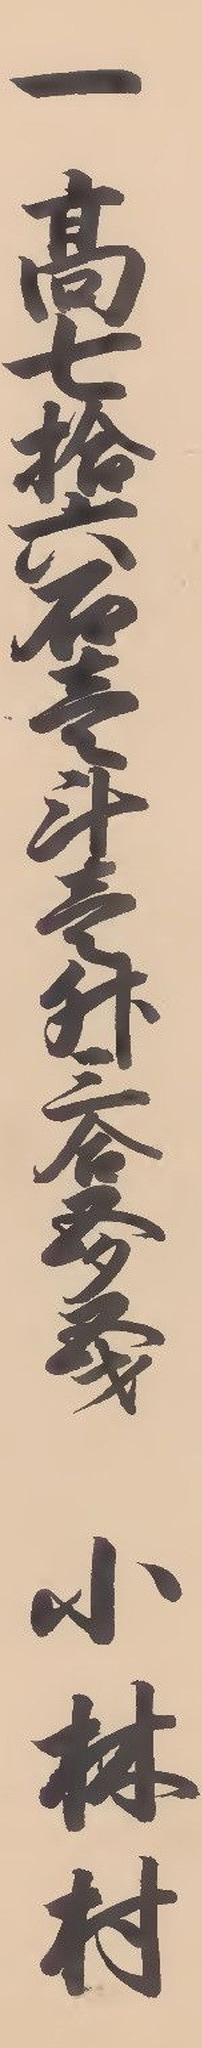一高七拾六石壱斗壱升三合五勺五才小林村
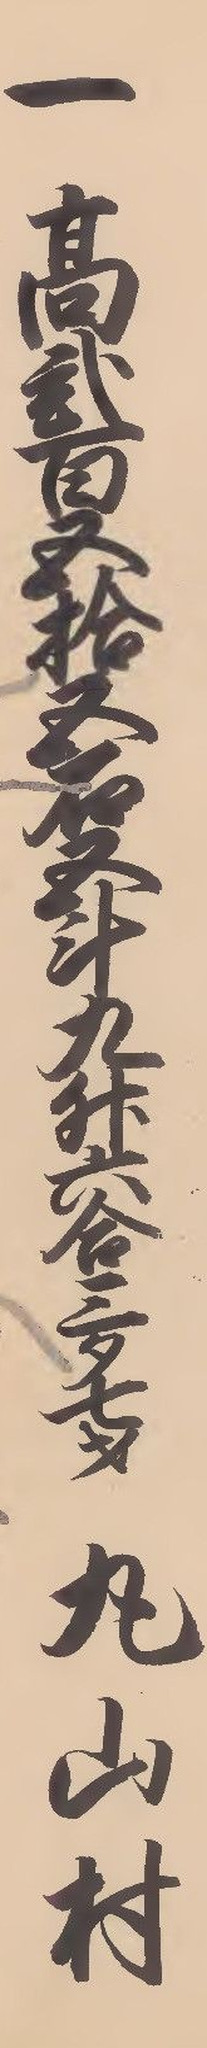一高弐百五拾五石五斗九升六合三勺七才丸山村
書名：伯耆国郷帳
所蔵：国立公文書館 National Archives of Japan
